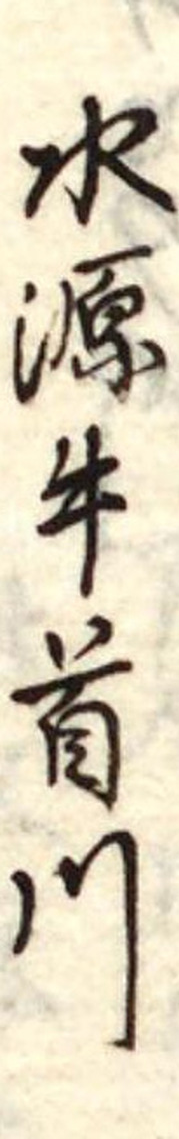水源牛首川
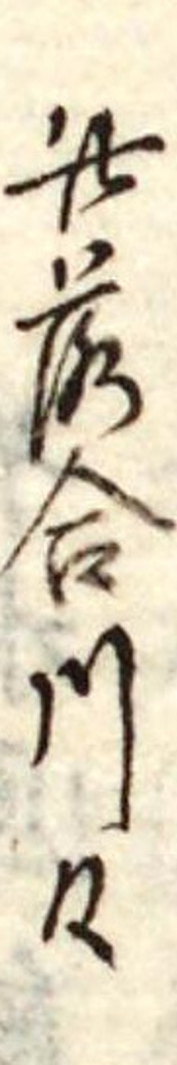此落合川々
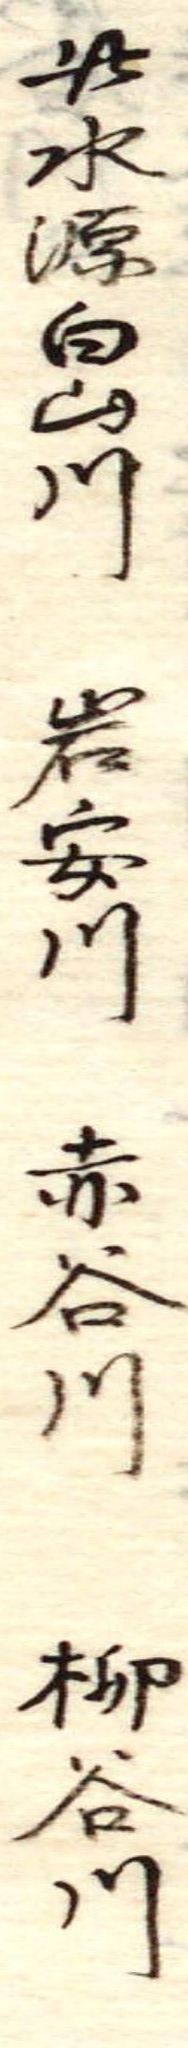此水源白山川岩安川赤谷川柳谷川
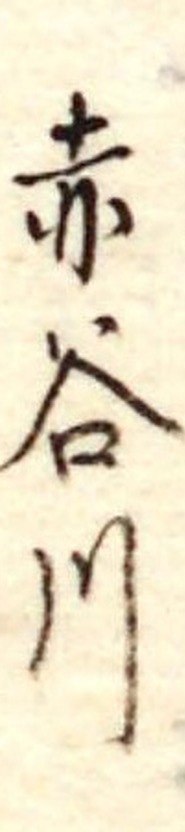郷谷川
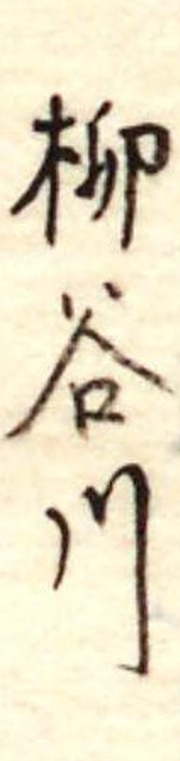郷谷川
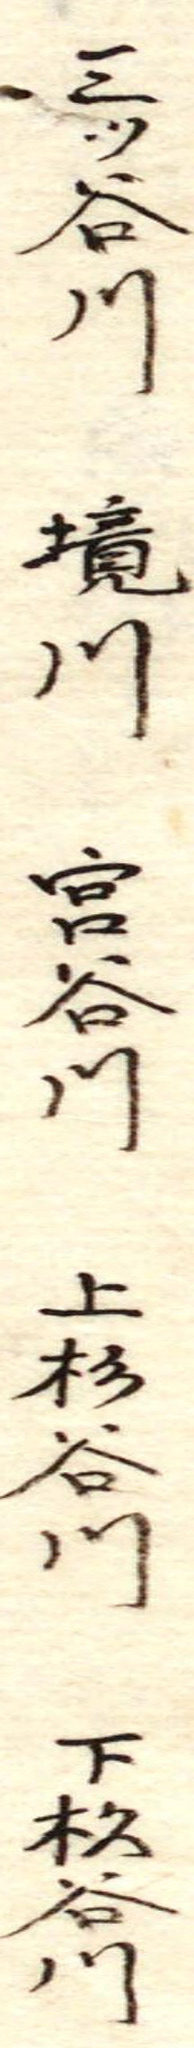三ッ谷川境川宮谷川上杉谷川下杉谷川
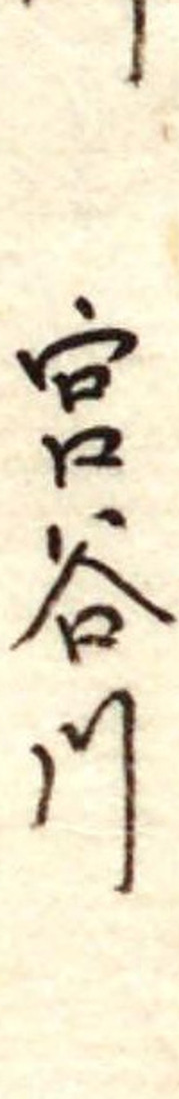郷谷川
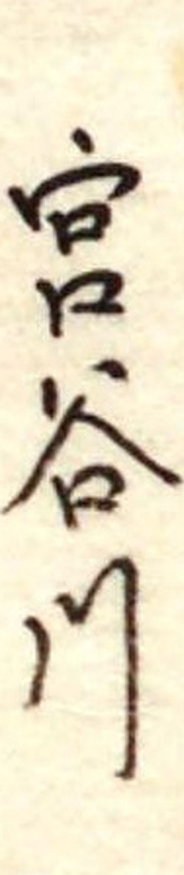郷谷川
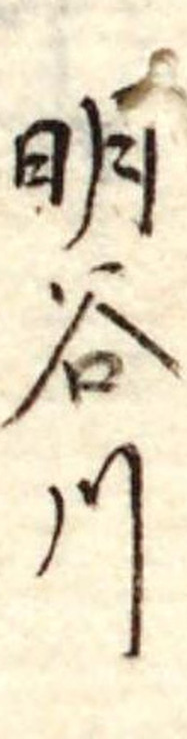郷谷川
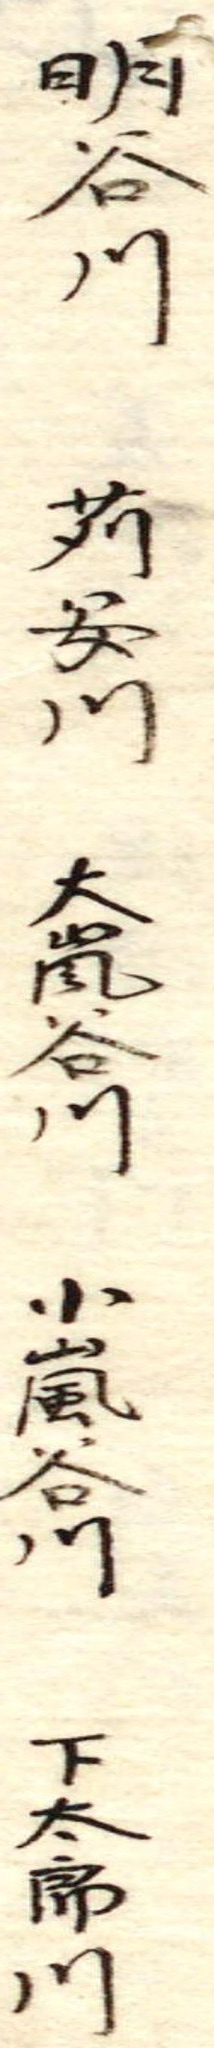明谷川苅安川大嵐谷川小嵐谷川下太郎川
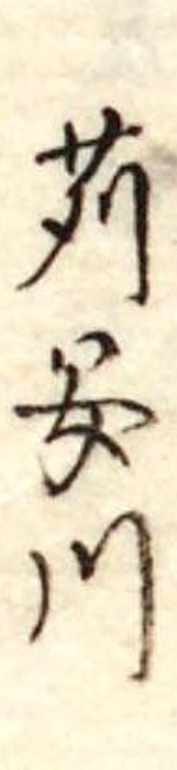郷谷川
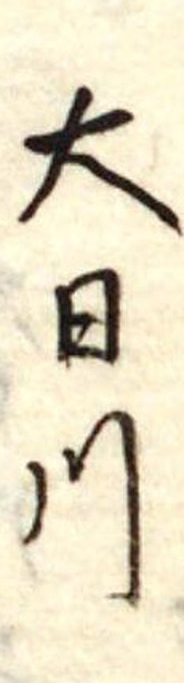大日川

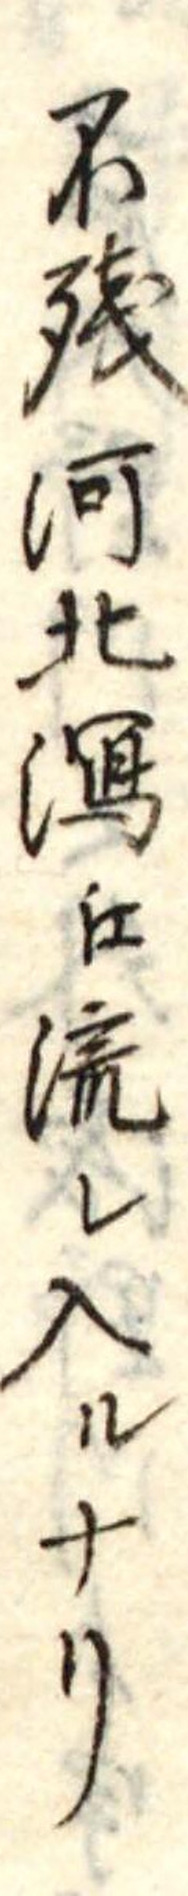不残河北潟え流レ入ルナリ
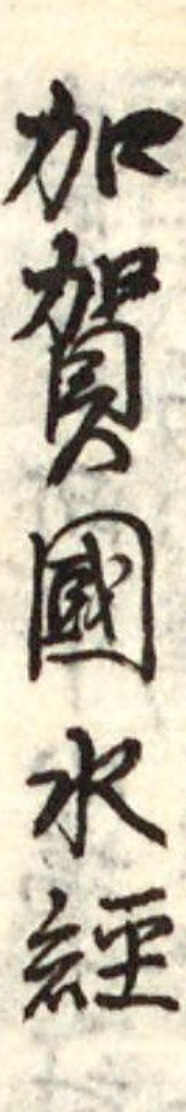加賀国水経
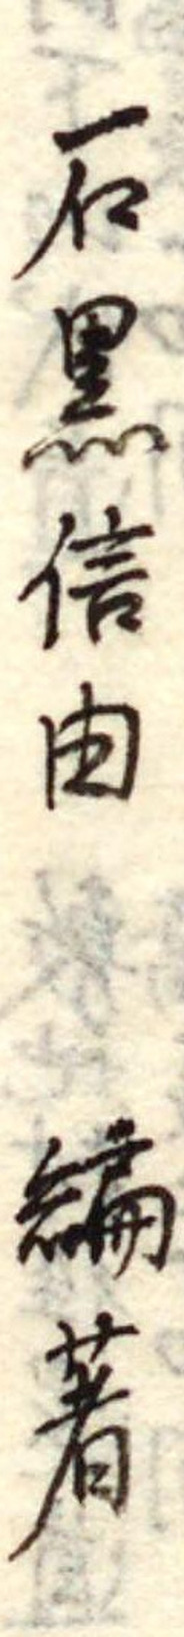石黒信由編著
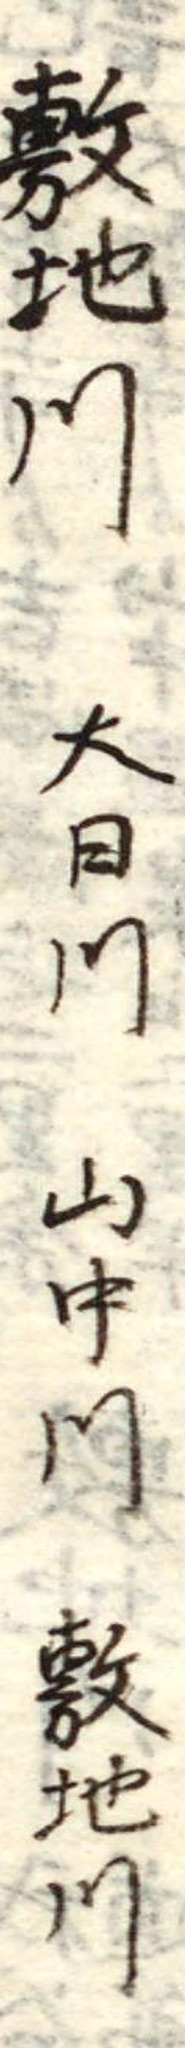敷地川大日川山中川敷地川
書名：増補大路水経
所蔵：Ishikawa Prefectural Library
